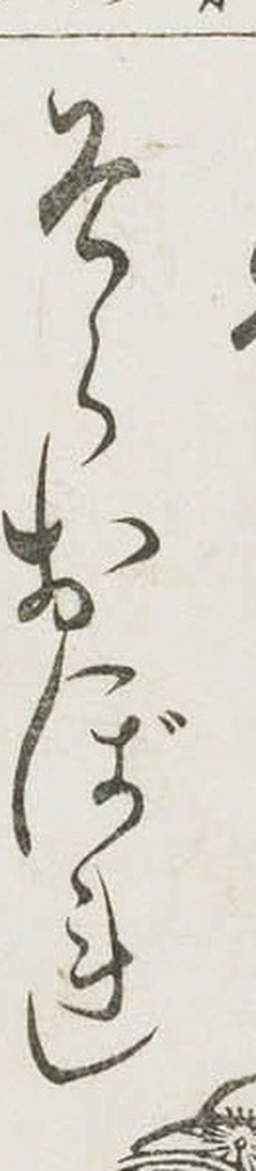そらおぼれ
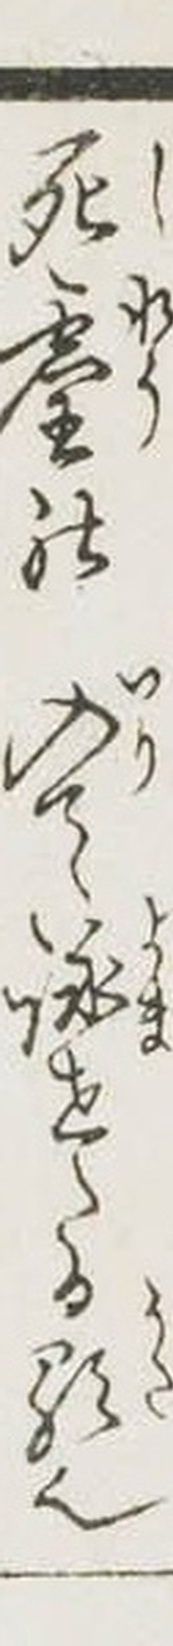死霊の入て詠せたる歌也
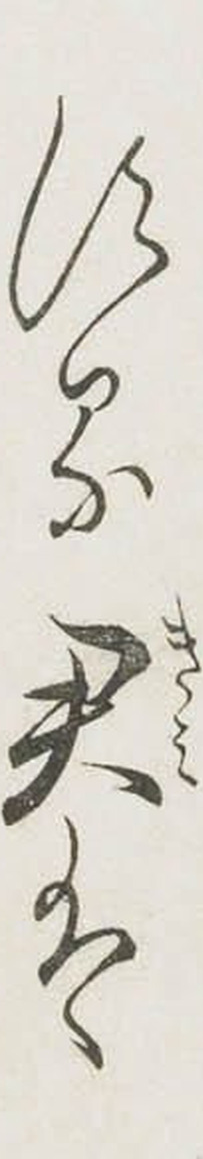する君は
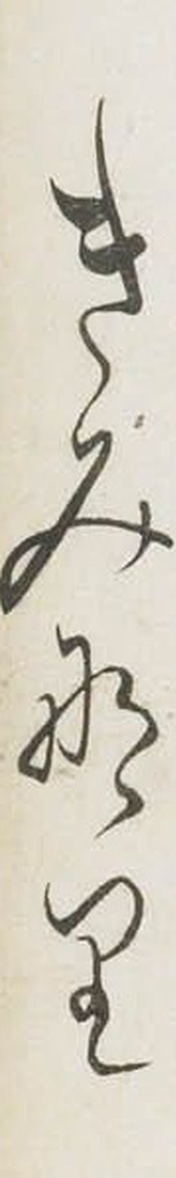きみなり
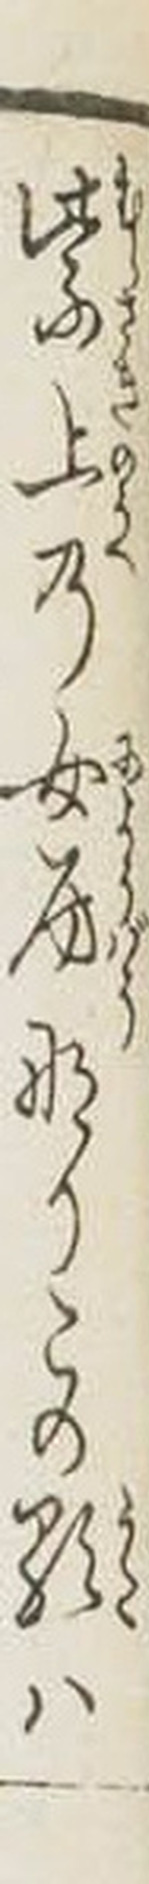紫上の女房なりこの歌は
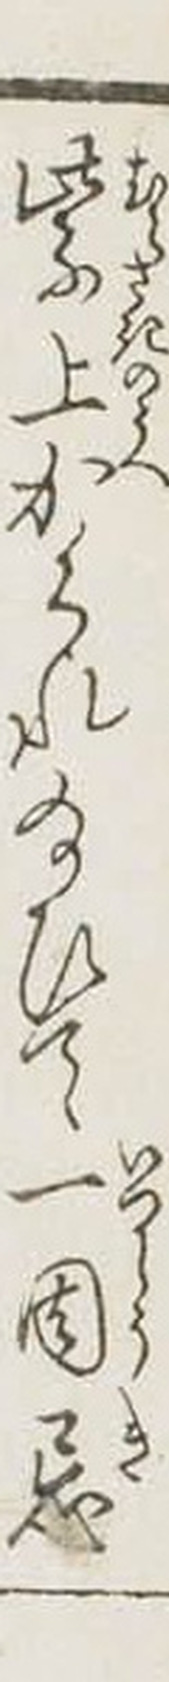紫上かくれ給ひて一周忌
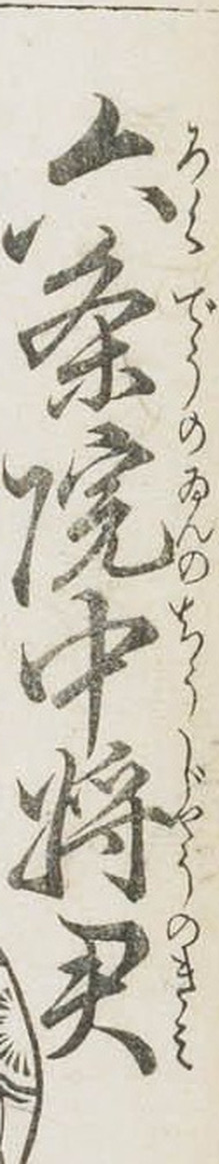六条院中将君
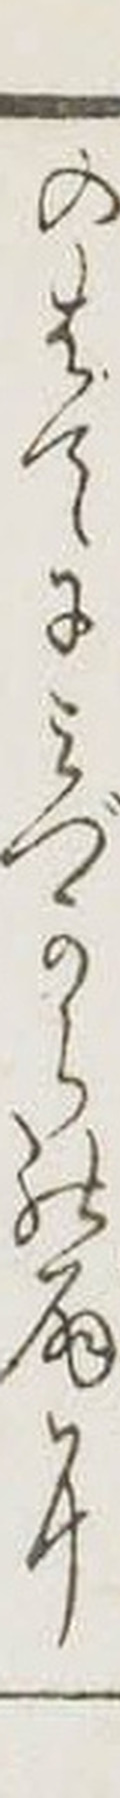のはてにみづからの扇に
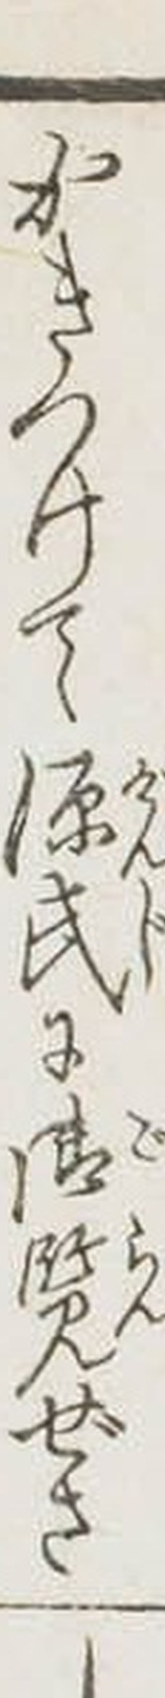かきつけて源氏に御覧ぜさ
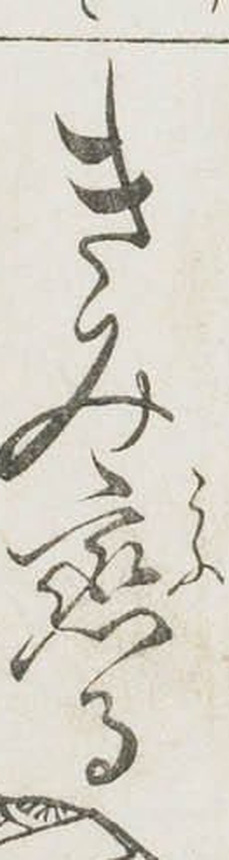きみ恋る
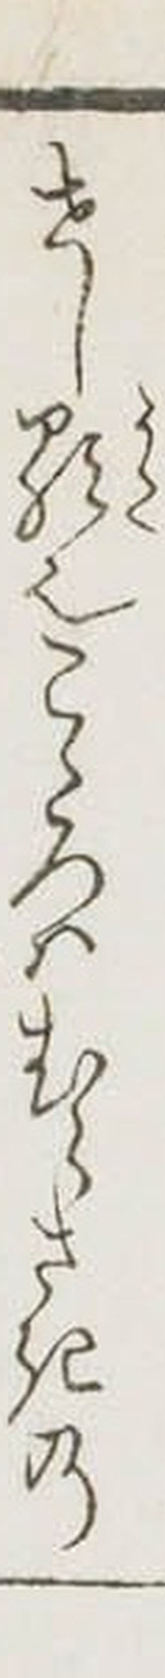せし歌也こゝろはむらさきの
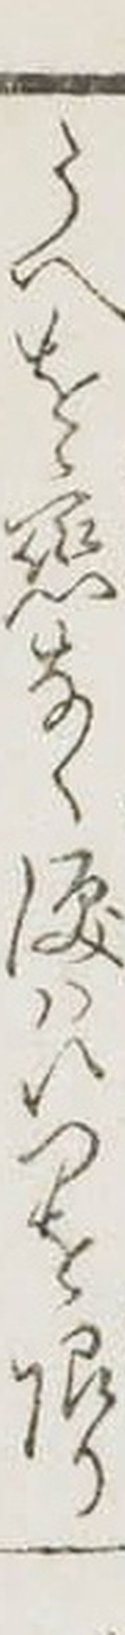うへを恋なく涙はいつを限り
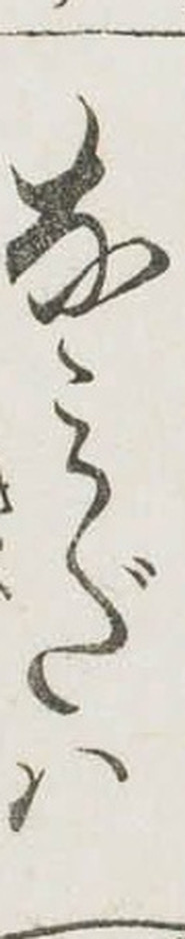なみだは
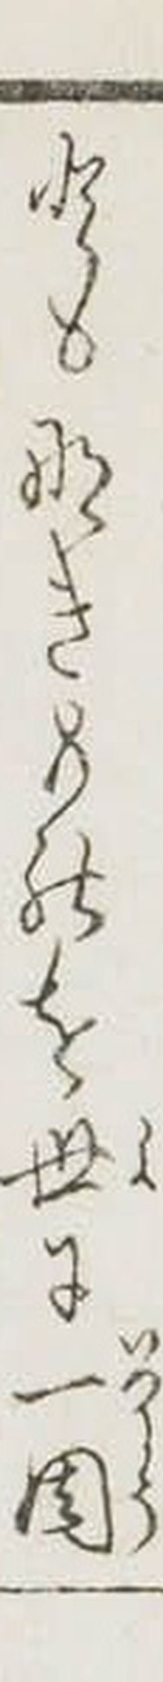ともなきものを世に一周
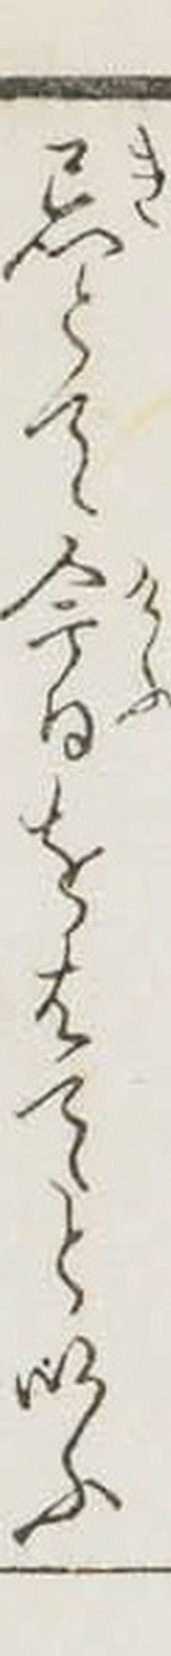忌とて今日をはてといふ
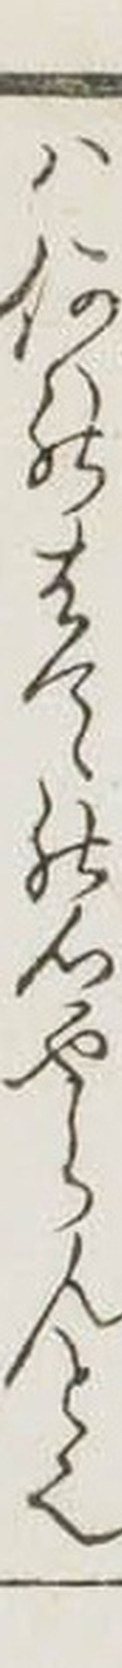は何のはての心やらんと也
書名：源氏百人一首
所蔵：東京学芸大学教育コンテンツアーカイブ
